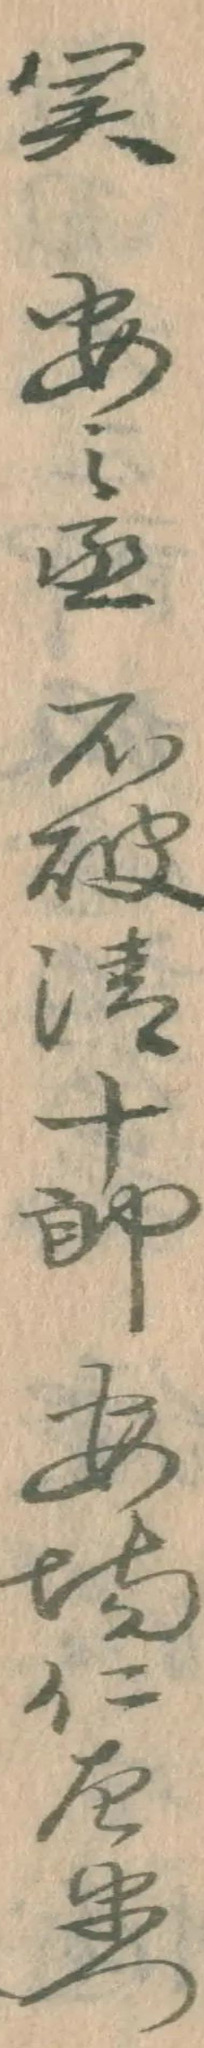関安之丞不破清十郎安場仁左衛門
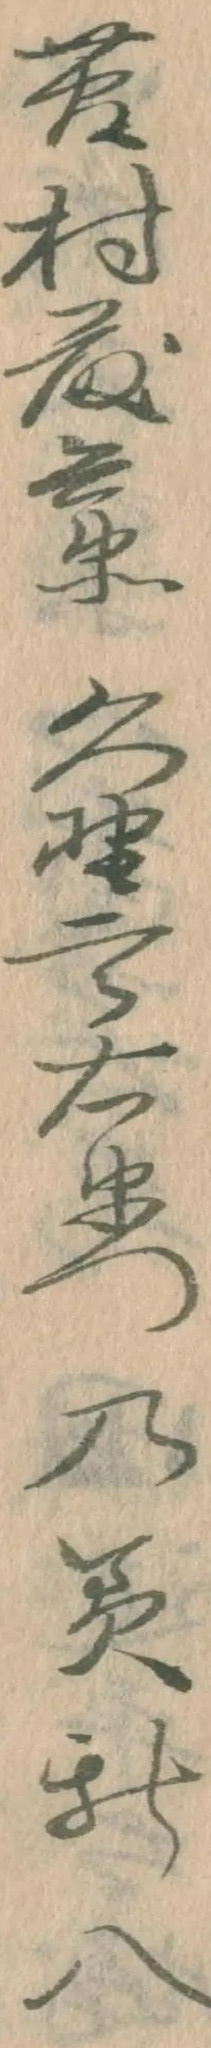菅村藤兵衛久野二郎右衛門乃美新八
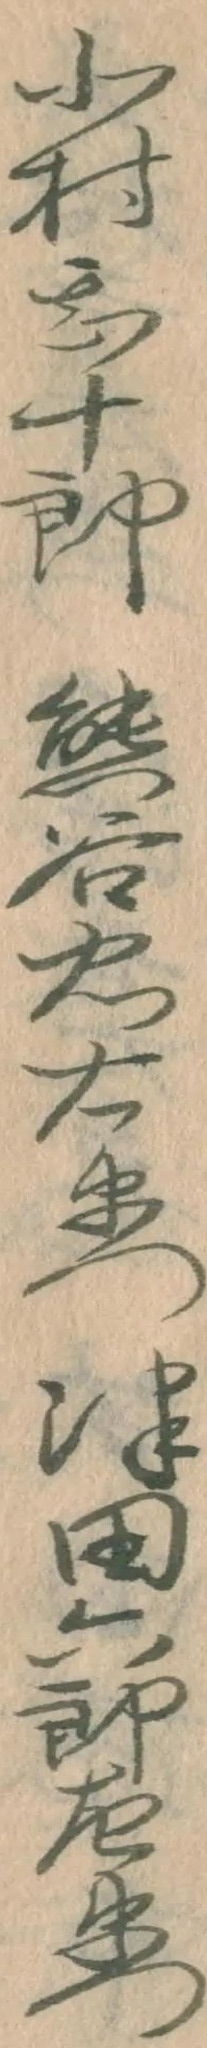北村甚十郎熊谷忠右衛門津田六郎左衛門
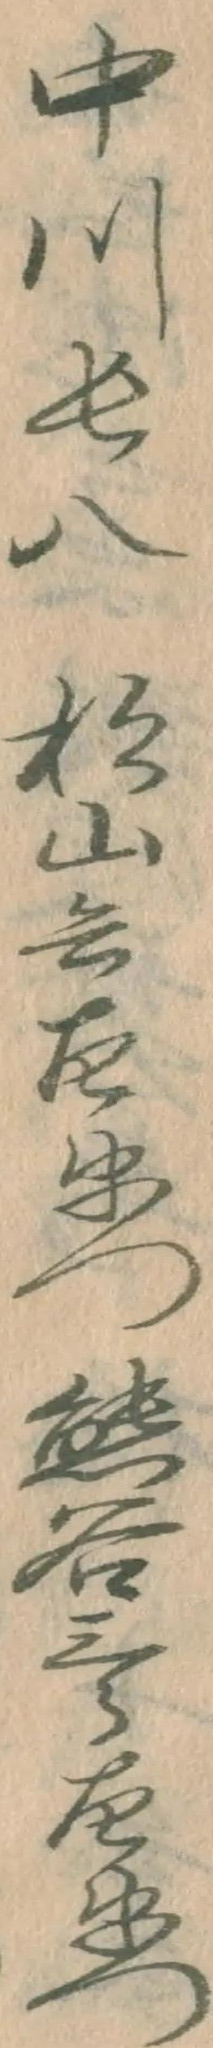中川長八杉山兵左衛門熊谷三郎左衛門
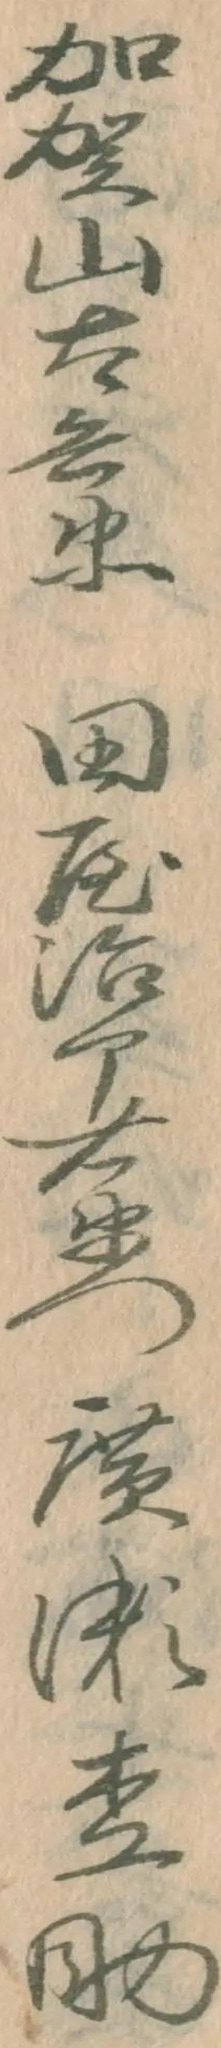加賀山太兵衛田屋治部右衛門広瀬杢助

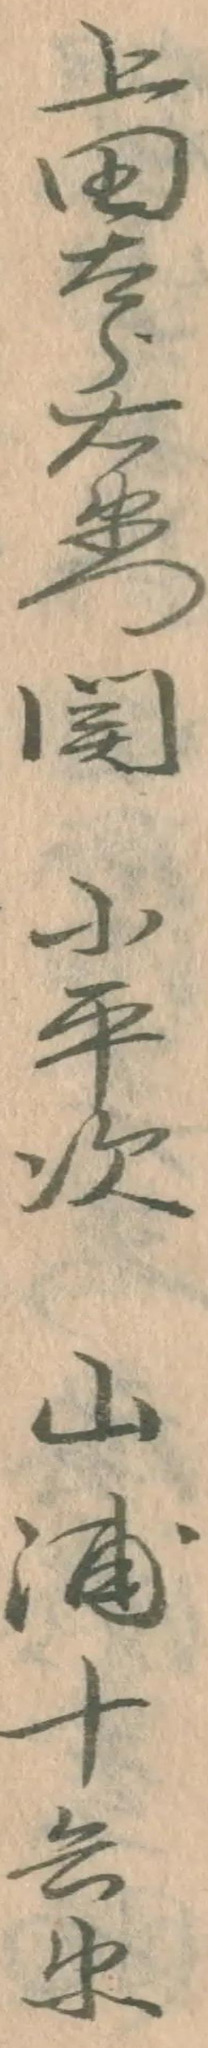上田太郎右衛門関小平次山浦十兵衛
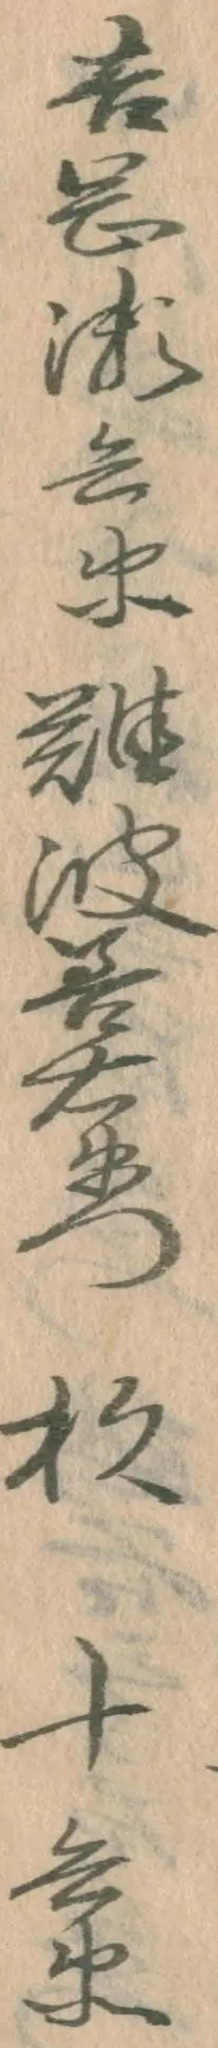吉岡瀬兵衛難波前右衛門杉十兵衛
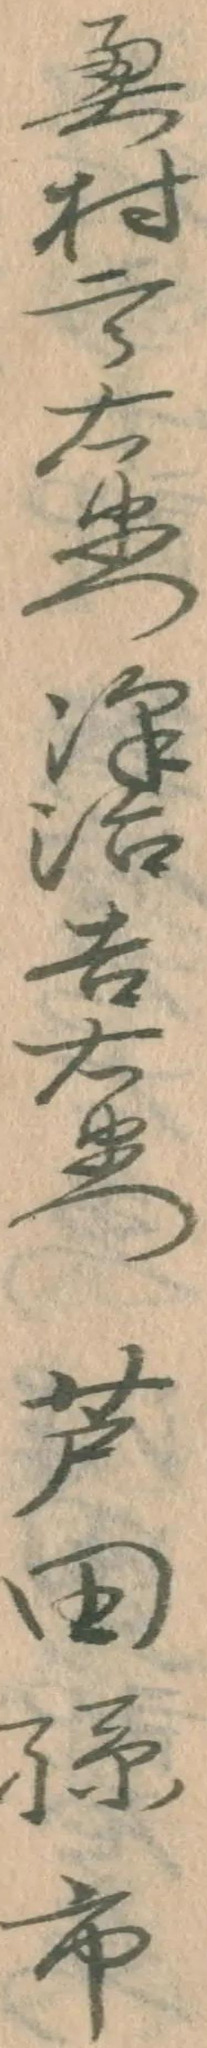奥村二郎右衛門沢治吉右衛門芦田孫市
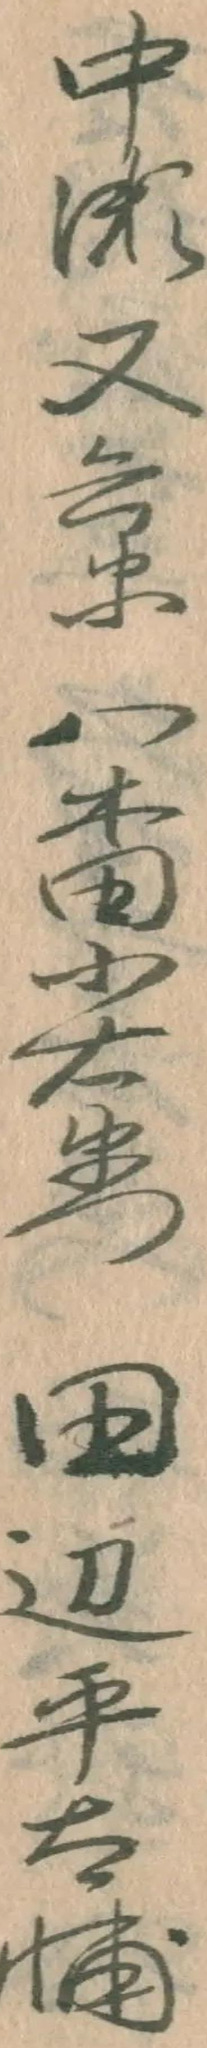中瀬又兵衛八木田小右衛門田辺平太輔
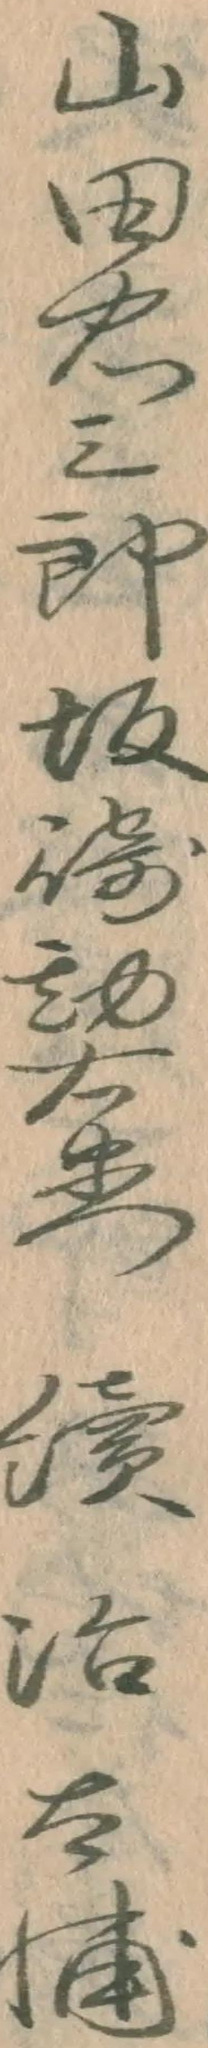山田忠三郎坂崎勘右衛門続治太輔
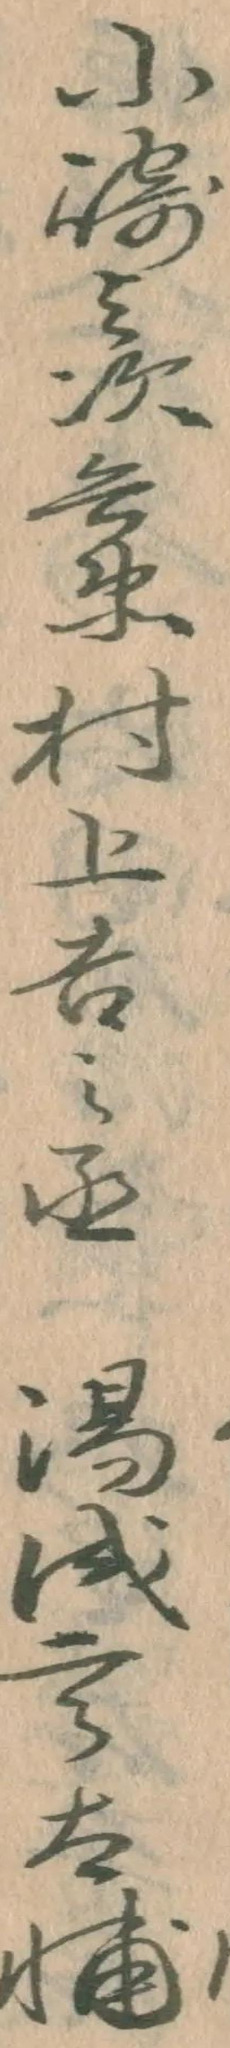小崎与次兵衛村上吉之丞湯浅二郎太輔
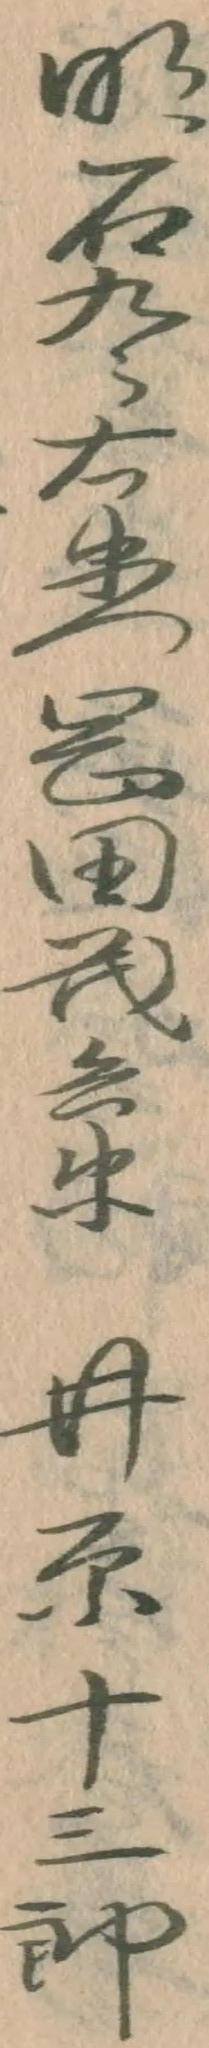明石九郎右衛門岡田茂兵衛井原十三郎
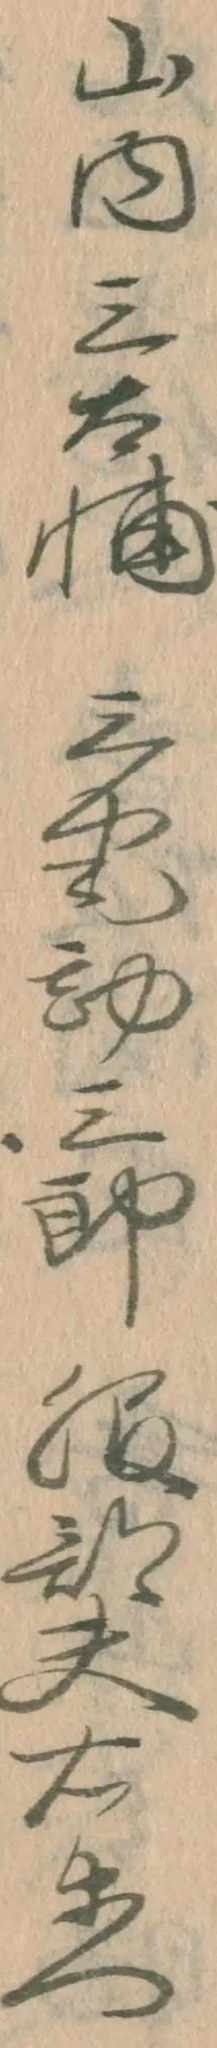山内三太輔三宅勘三郎服部夫右衛門
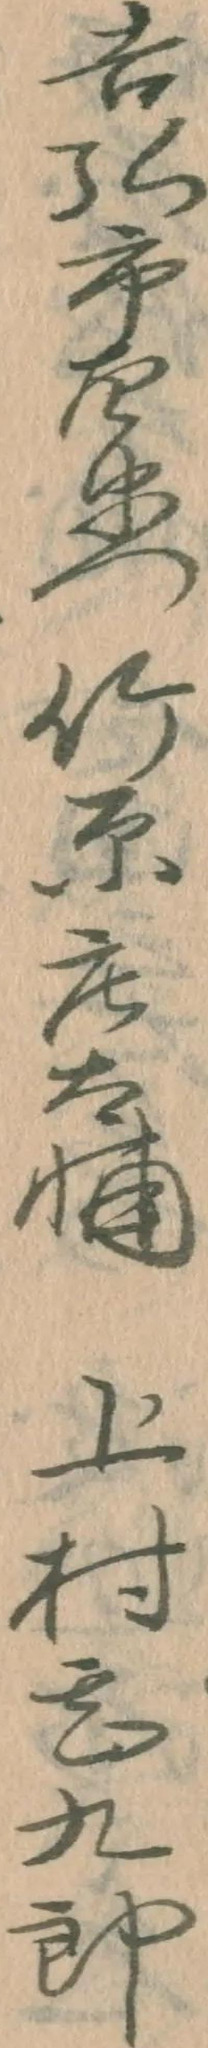吉弘市左衛門竹原庄太輔上村甚九郎
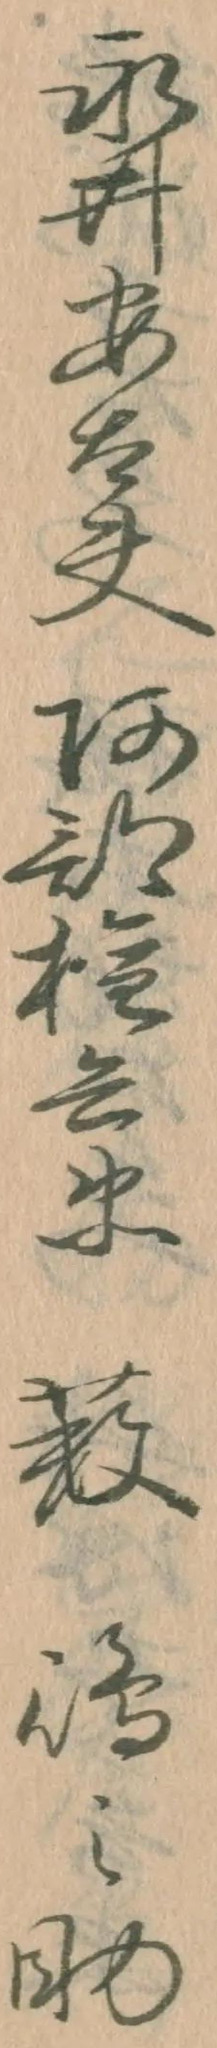永井安太夫阿部権兵衛藪島之助
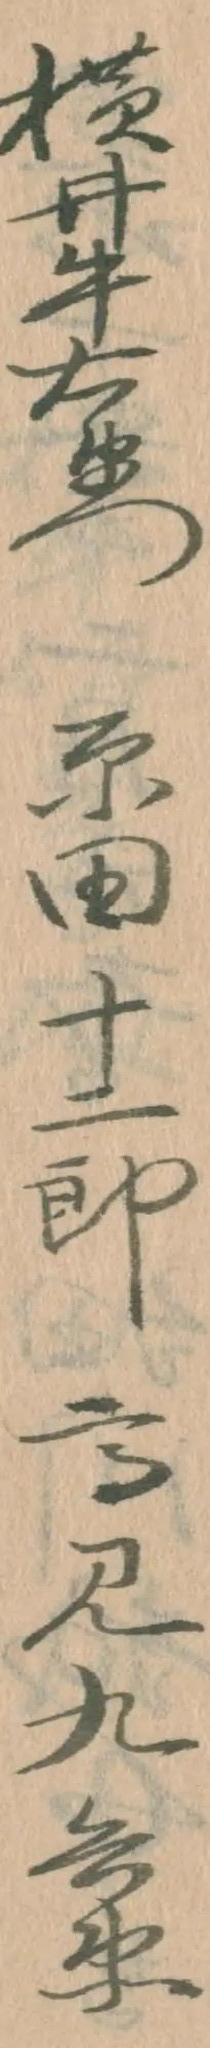横井牛右衛門原田十二郎高見九兵衛
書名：切支丹御退治記 49巻. [9]
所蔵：国立国会図書館 National Diet Library, JAPAN
